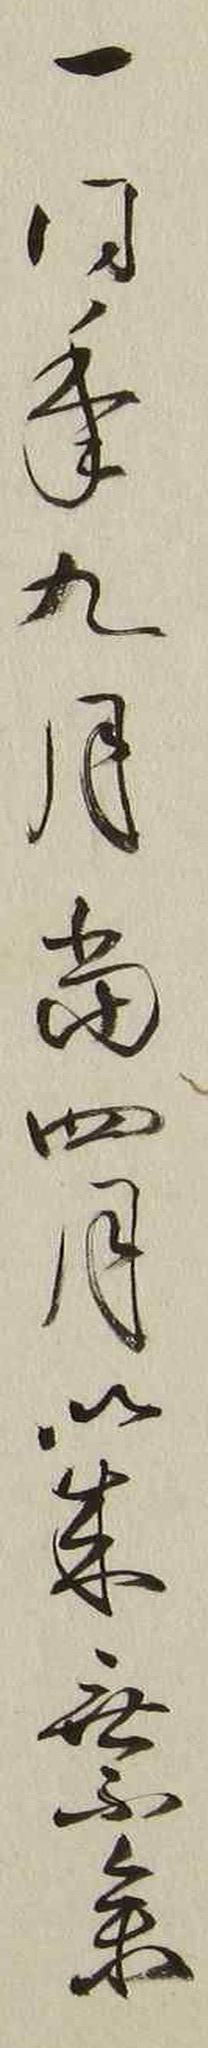一同年九月当四月以来無不参
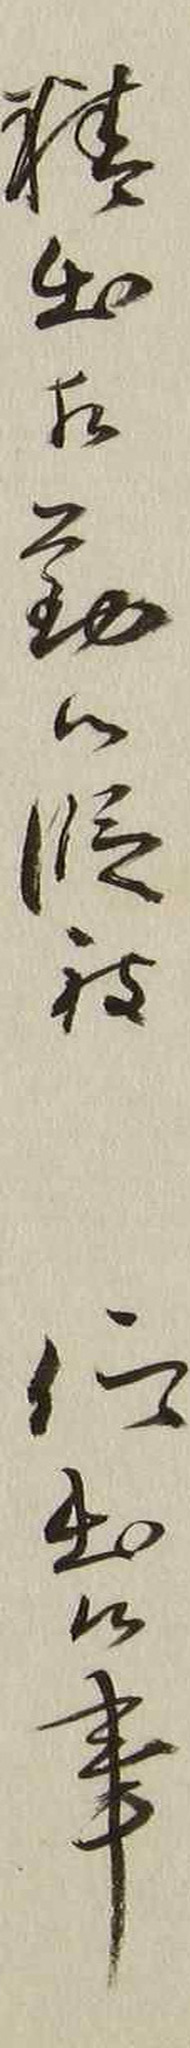精出相勤候段被仰出候事
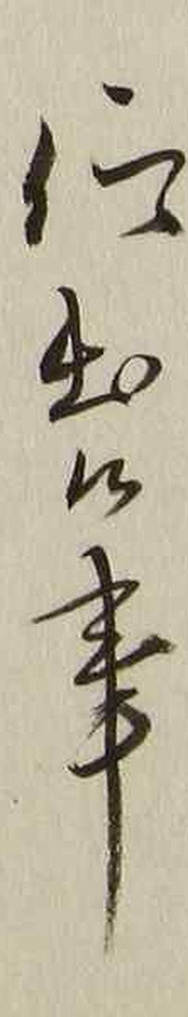仰付候事
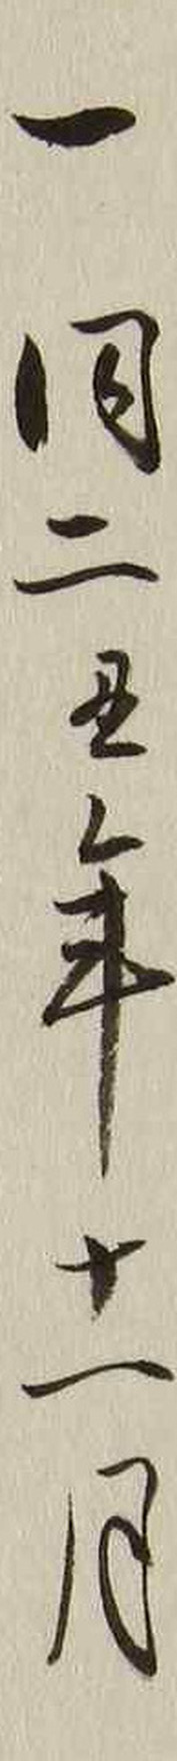一同二丑年十一月
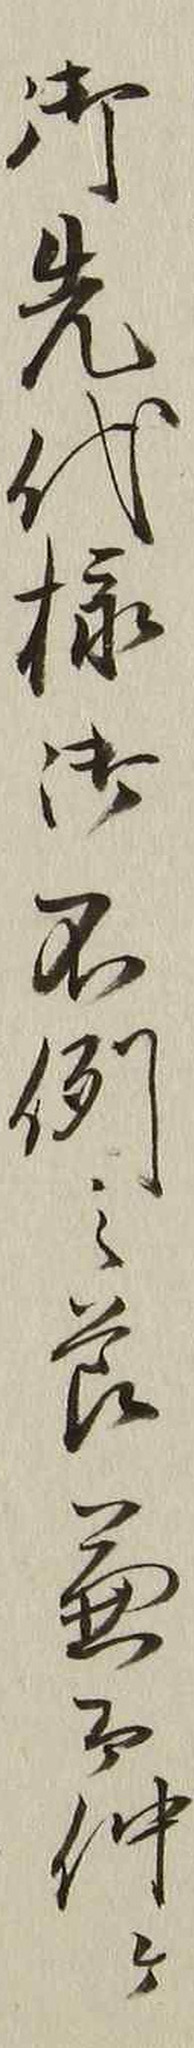御先代様御不例之節兼而仲ケ
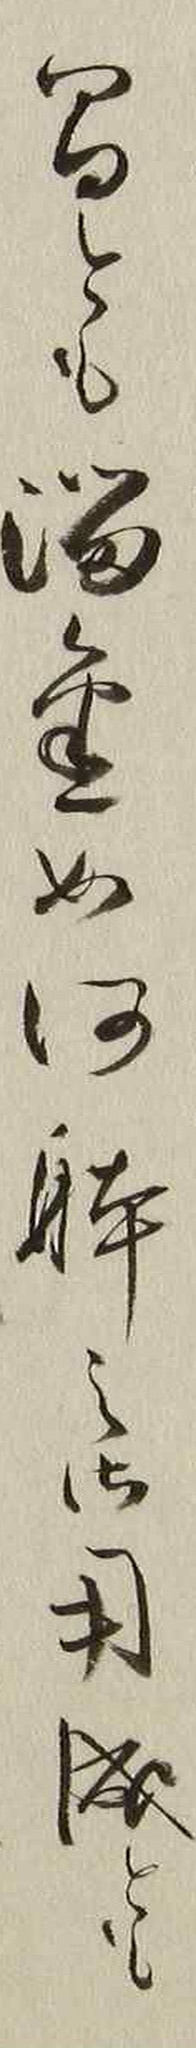間とも溜置如何体之御用成とも
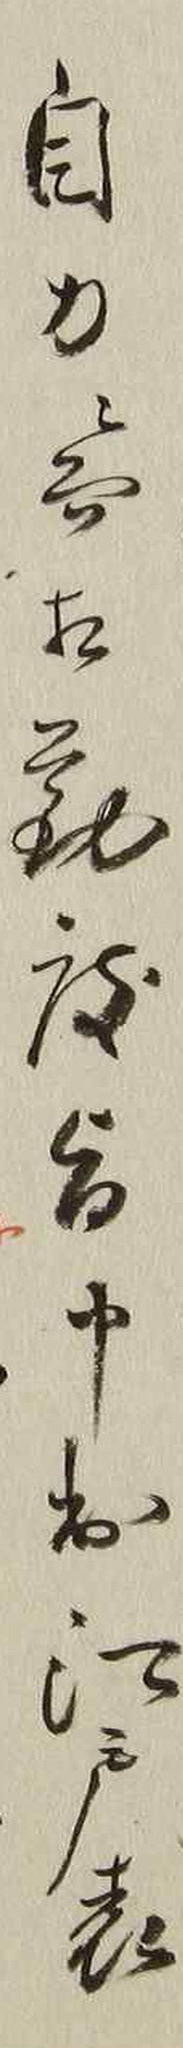自力ニ而相勤度旨申出江戸表
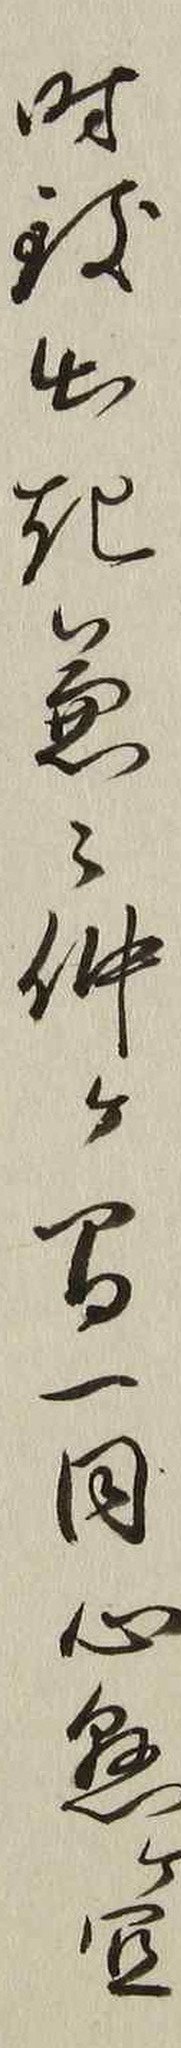時致出起兼々仲ケ間一同心懸ヶ宜
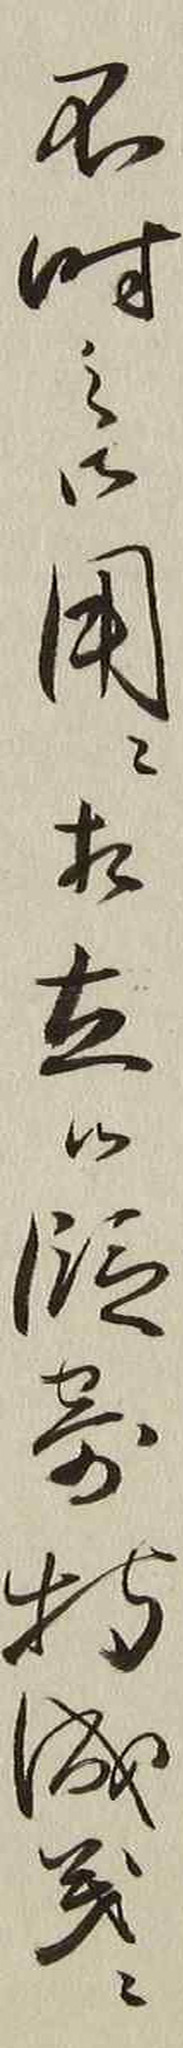不時之御用ニ相立候段奇特成義ニ
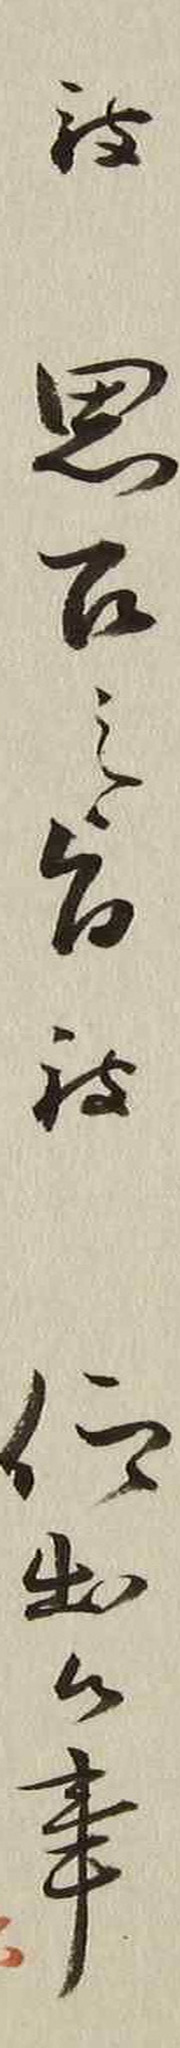被思召之旨被仰出候事
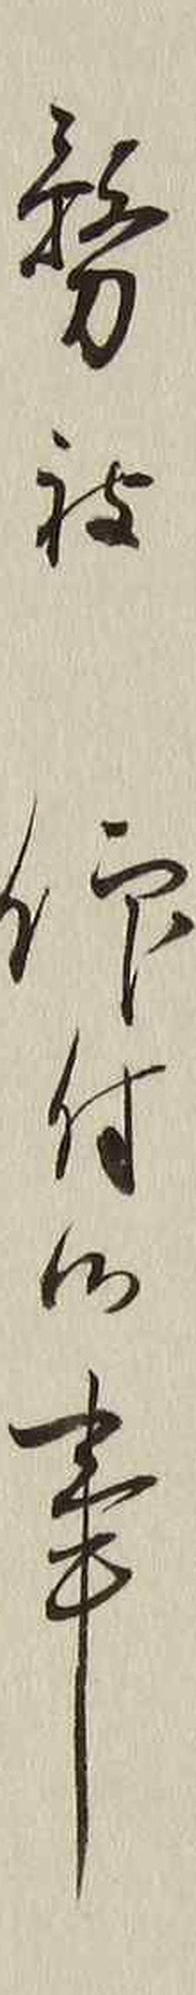務被仰付候事
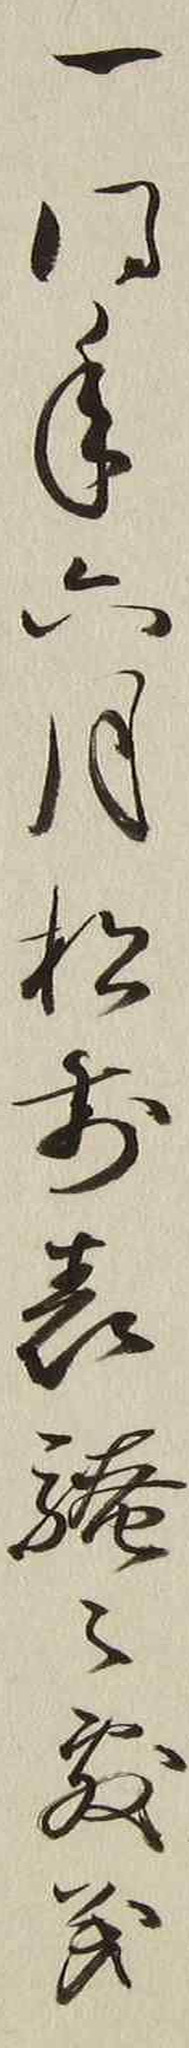一同年六月松前表騒々敷義
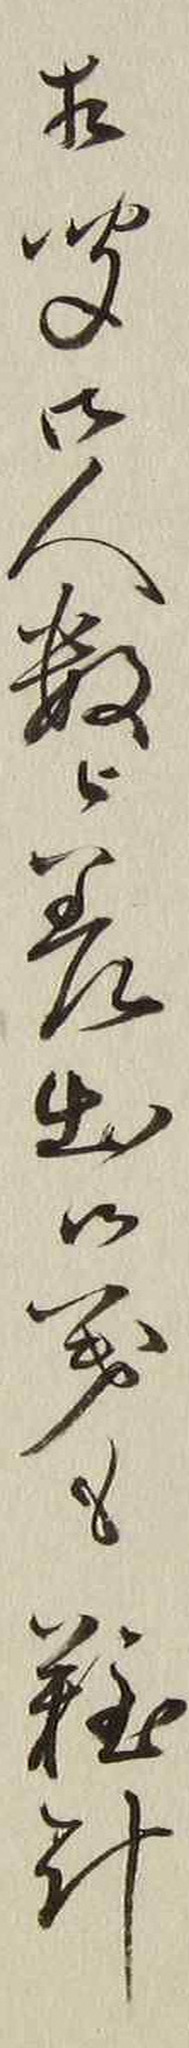相聞御人数被差出候義も難計
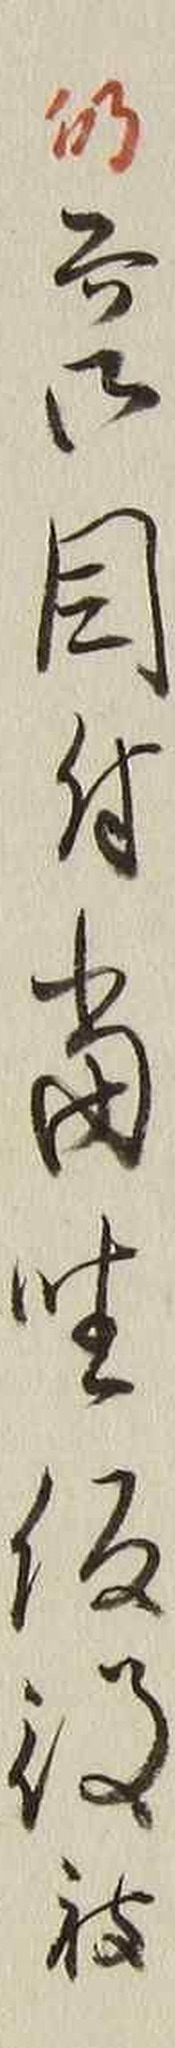仍而御目付当座仮役被
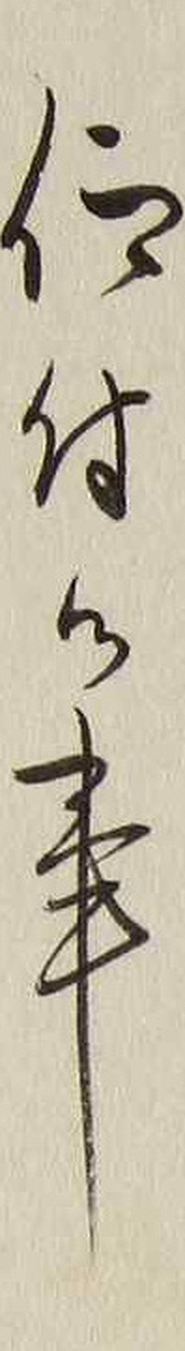仰付候事
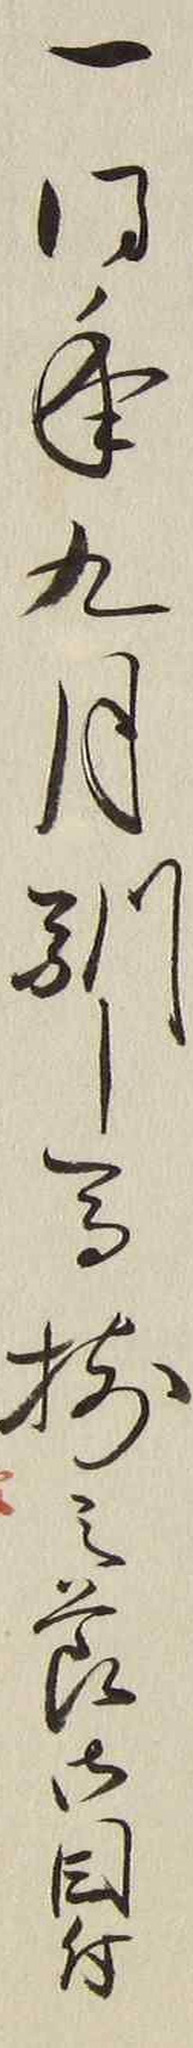一同年九月馴し馬揃之節御目付
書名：諸士系譜　巻之163　な之部5
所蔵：会津若松市立会津図書館
